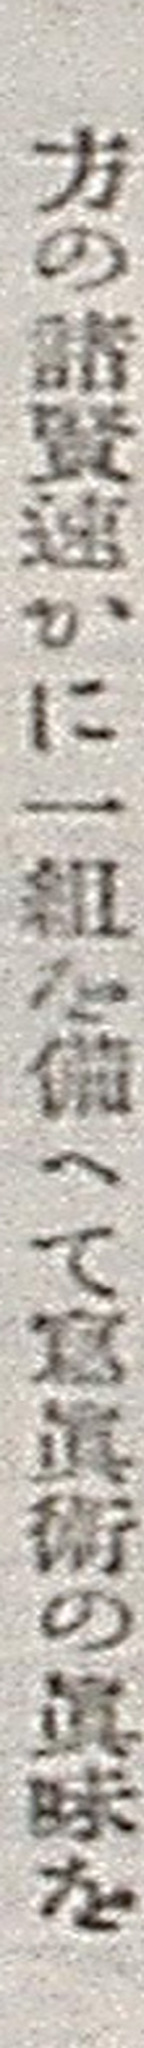方の諸賢速かに一組を備へて写真術の真味を
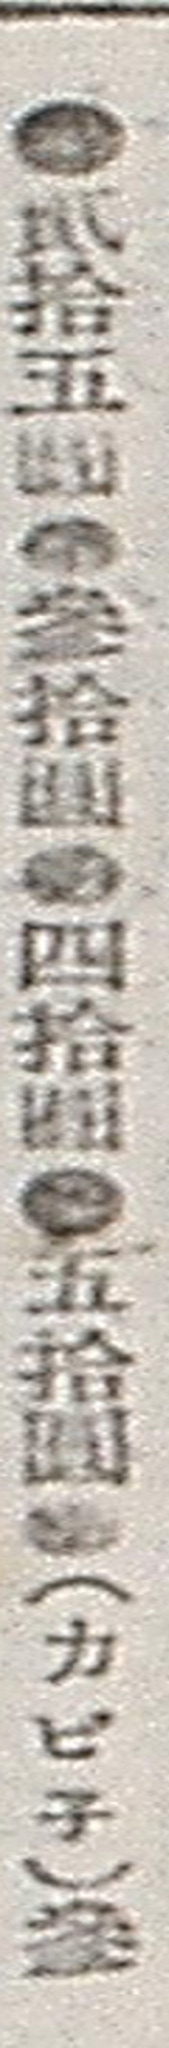●弐拾五円●参拾円●四拾円●五拾円●参
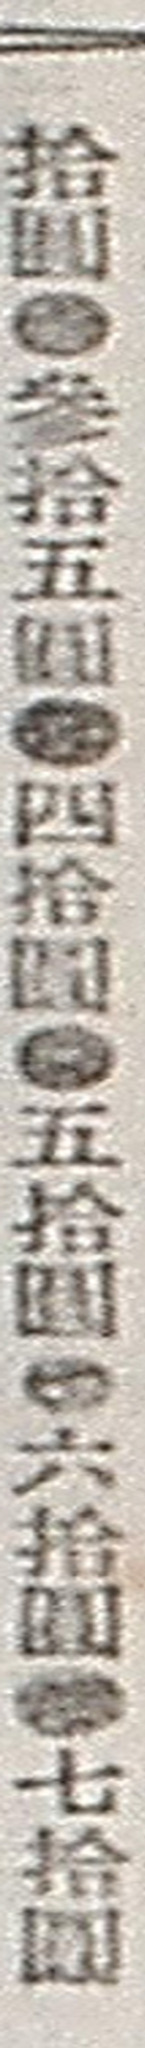拾円●参拾五円●四拾円●五拾円●六拾円●七拾円
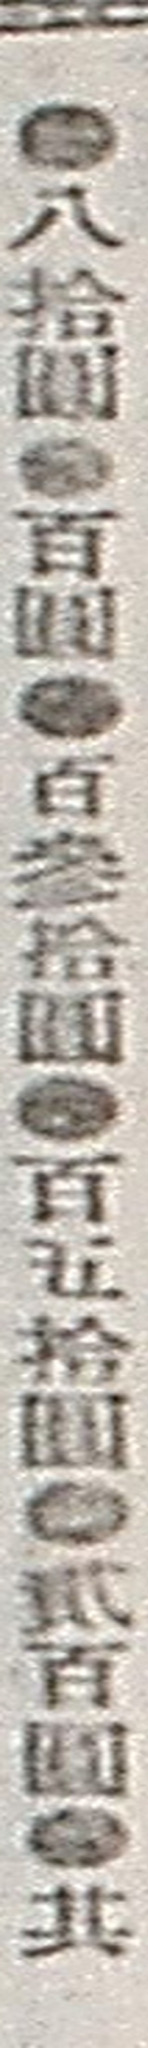●八拾円●百円●百参拾円●百五拾円●弐百円●其
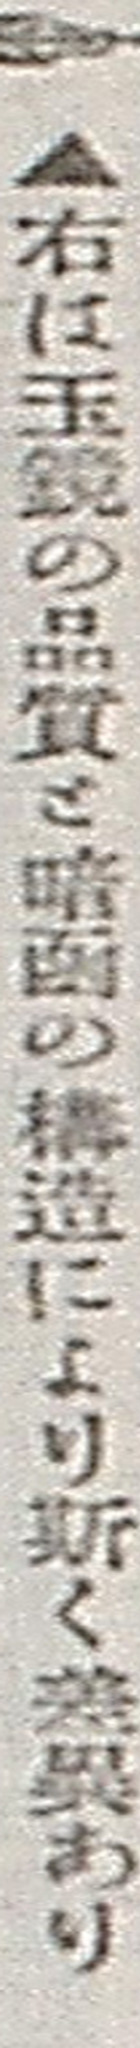▲右は玉鏡の品質と暗函の構造により斯く差異あり
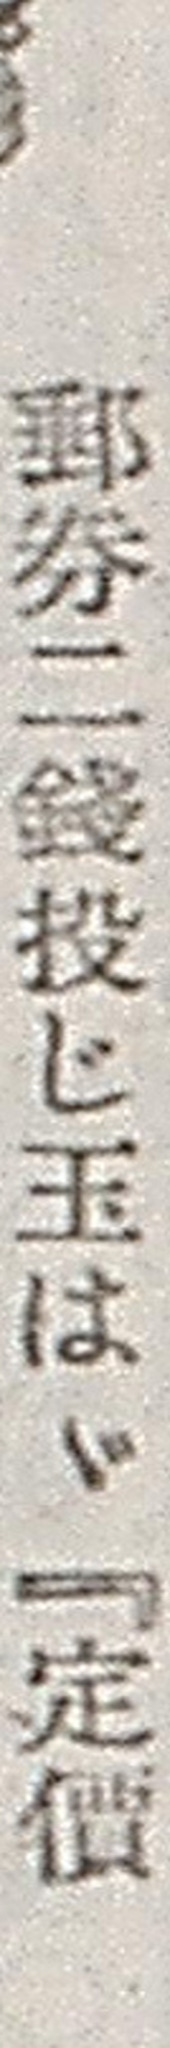郵券二銭投じ玉はゞ『定価
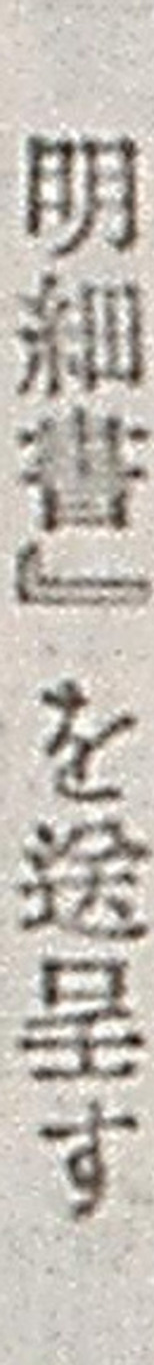明細書』を送呈す
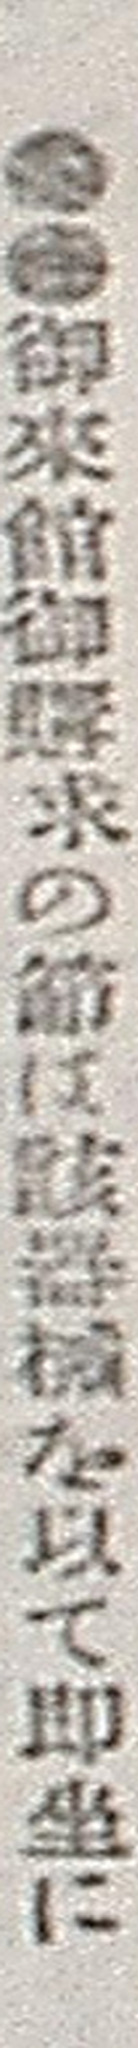●●御来館御購求の節は該器械を以て即坐に
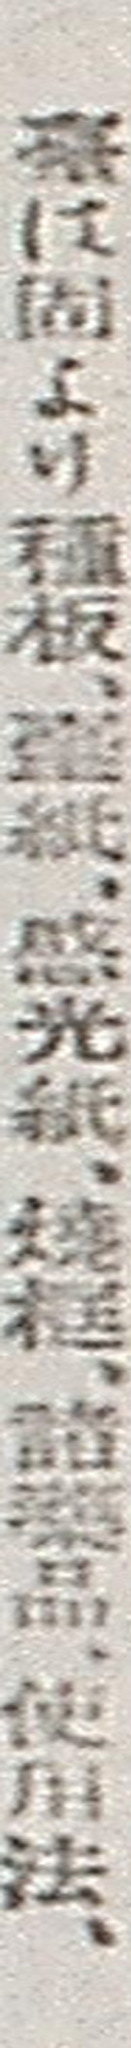台は固より種板、歪紙、感光紙、焼框、諸薬品、使用法、
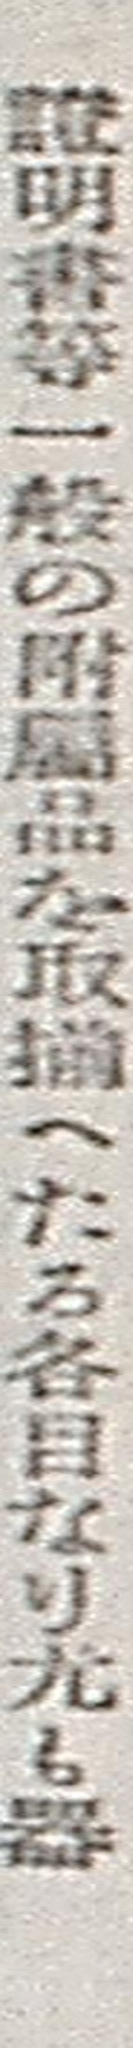証明書等一般の附属品を取揃へたる各目なり尤も器
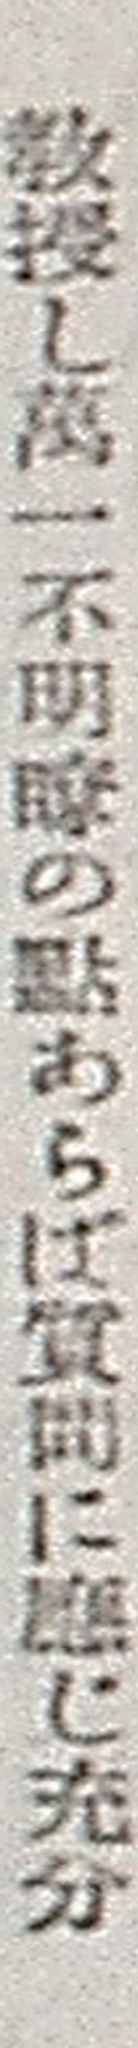教授し万一不明瞭の点あらば質問に応じ充分
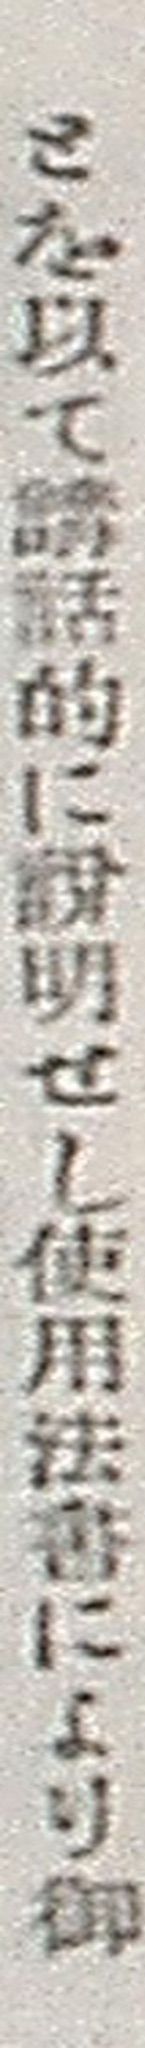とを以て講話的に説明せし使用法書により御
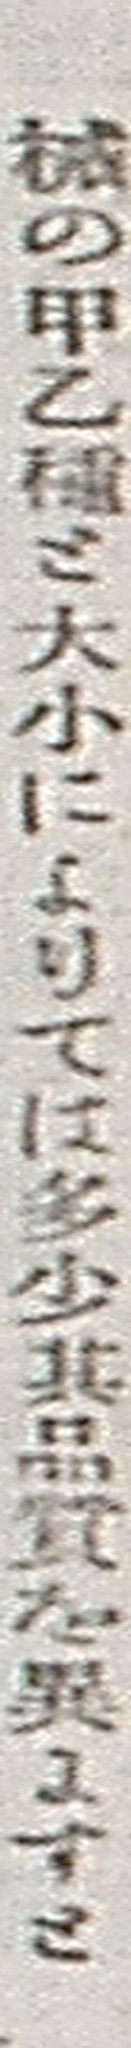械の甲乙種と大小によりては多少其品質を異にすと
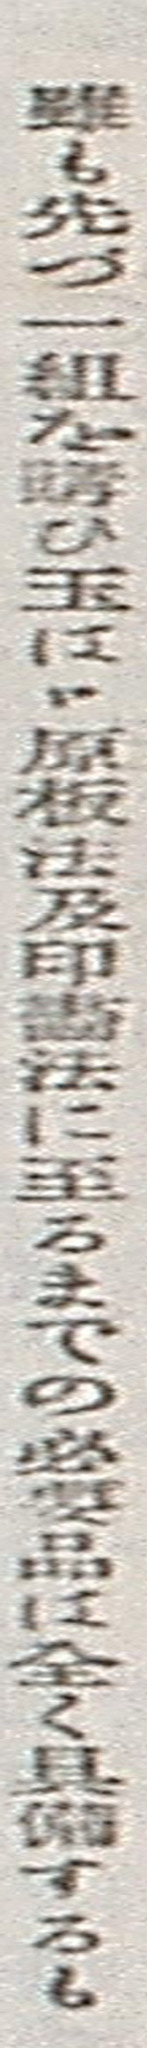雖も先づ一組を購ひ玉はゞ原板法及印画法に至るまでの必要品は全く具備するも
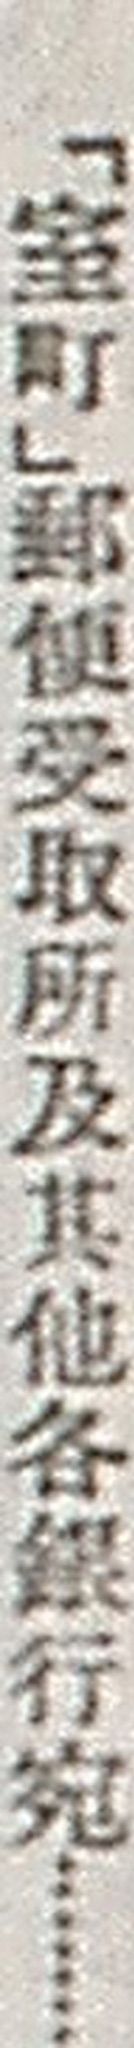「室町」郵便受取所及其他各銀行宛
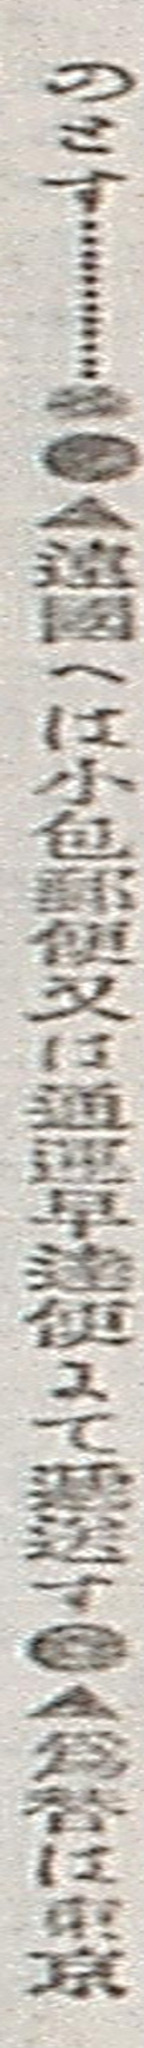のとす●▲遠国へは小包郵便又は通運早達便にて逓送す●▲為替は東京
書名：風俗畫報臨時増刊第百二十號　大海嘯被害録（下）
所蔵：東京大学地震研究所図書室 Earthquake Research Institute Library, The University of Tokyo, JAPAN
